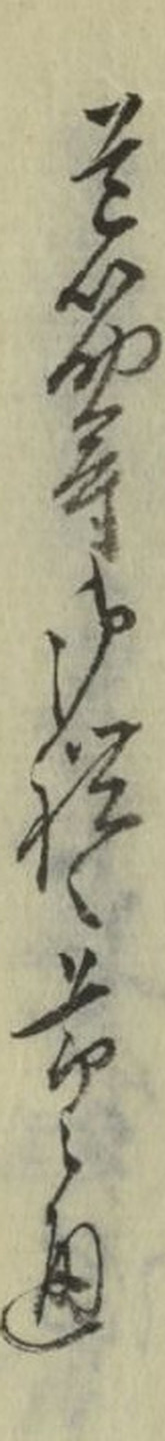道筋等御礼之節之通

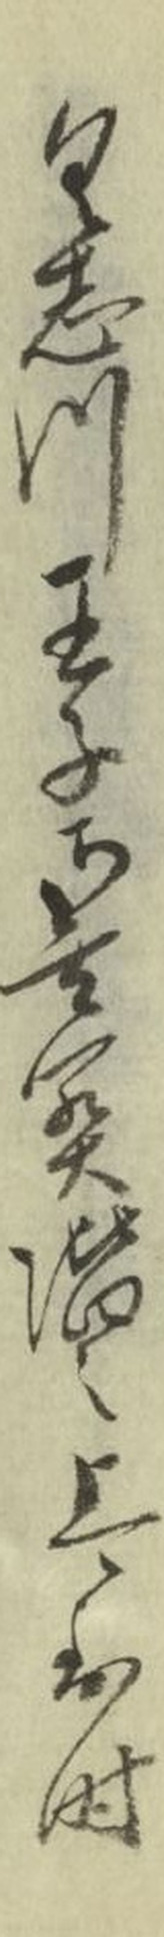具志川王子御玄関階之上に到時
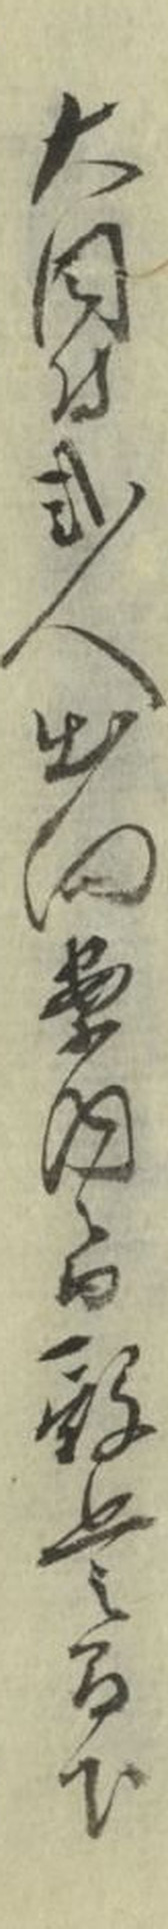大目付弐人出向案内之而殿上之間下
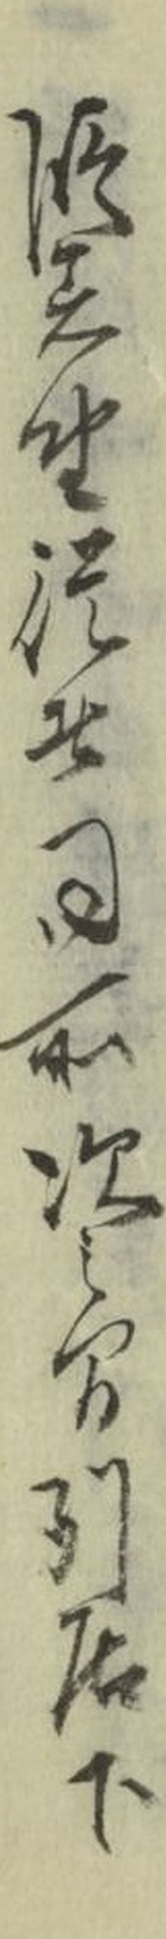段着坐従者同所次之間列居下
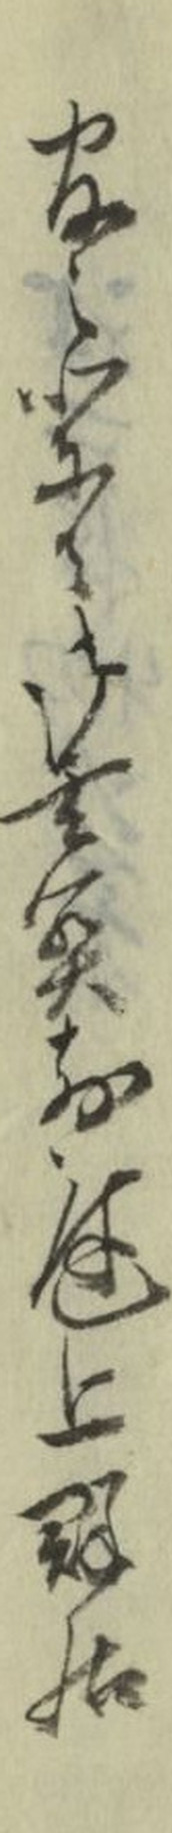官之輩は御玄関前庭上群居
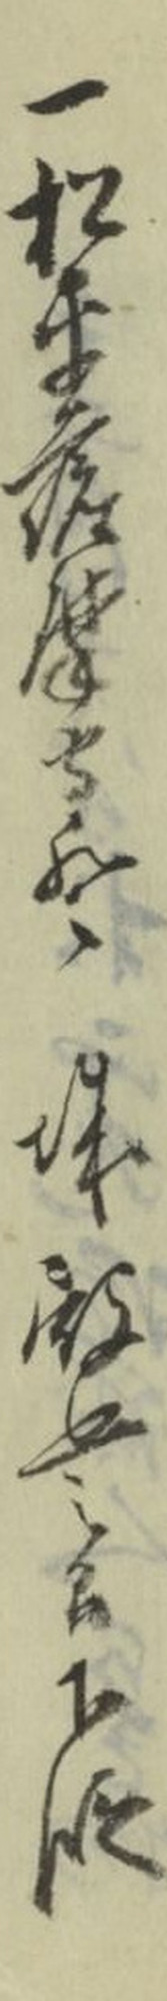一松平薩摩守登城殿上之間下段
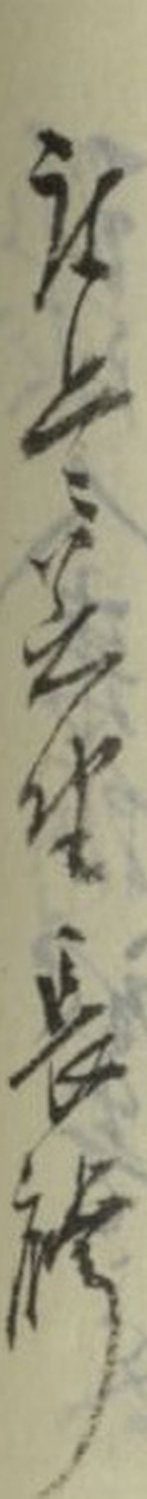座上に着坐長袴
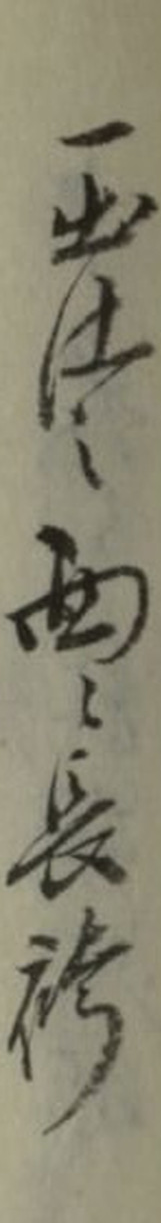一出仕之面々長袴
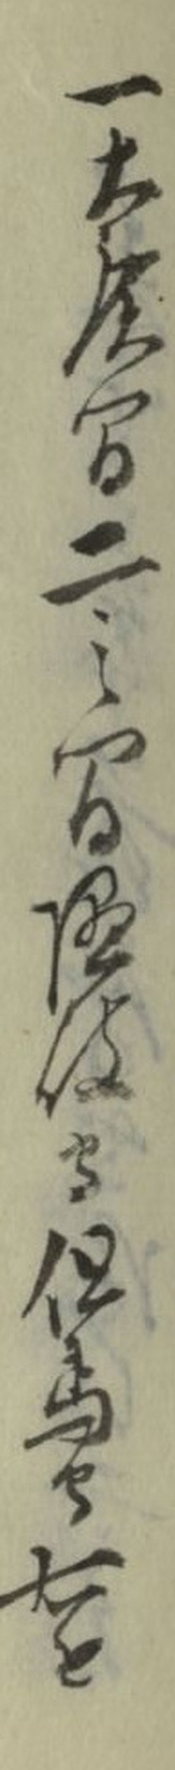一大広間二之間隠岐守但馬守右近
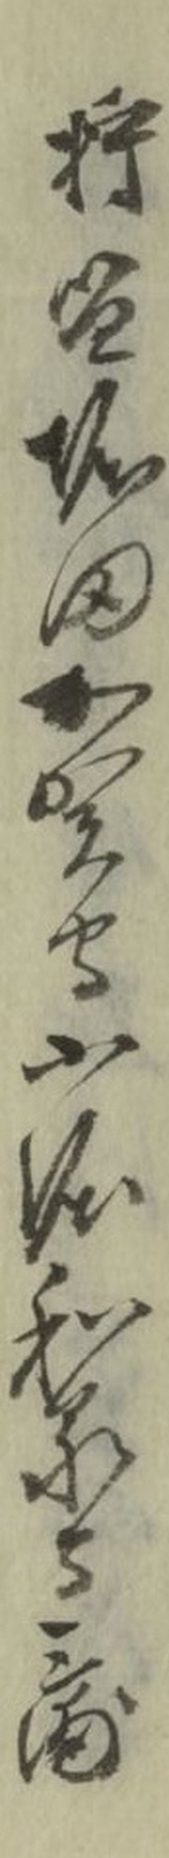将監堀田加賀守小堀和泉守三浦
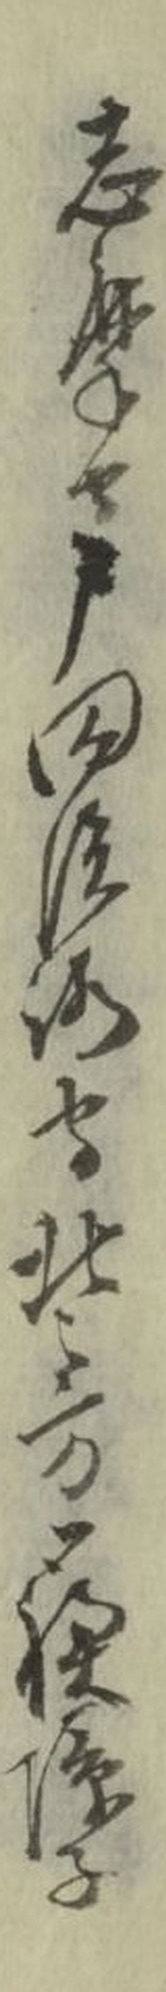志摩守戸田淡路守北之方御襖障子
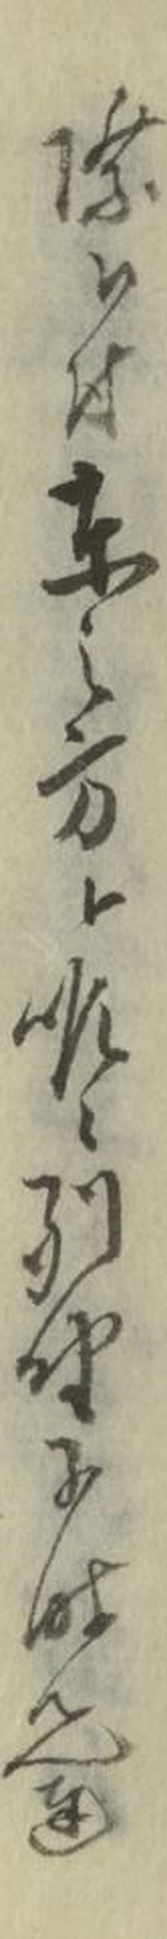際え付東之方え順々列坐于時先達
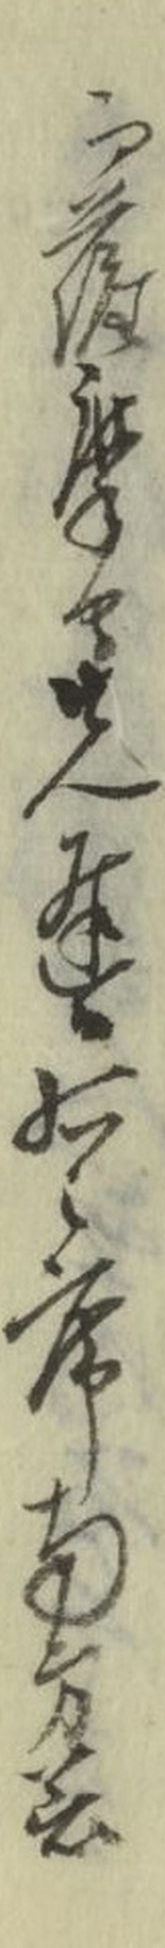而薩摩守先達而右之席南方着

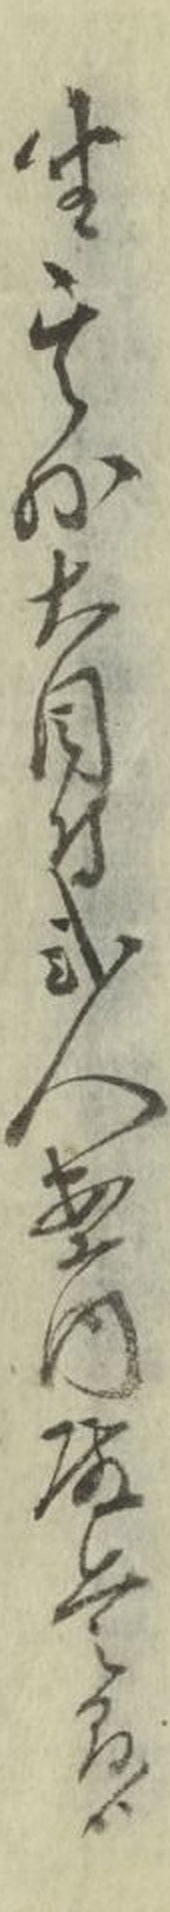坐其前大目付弐人案内殿上之間ゟ
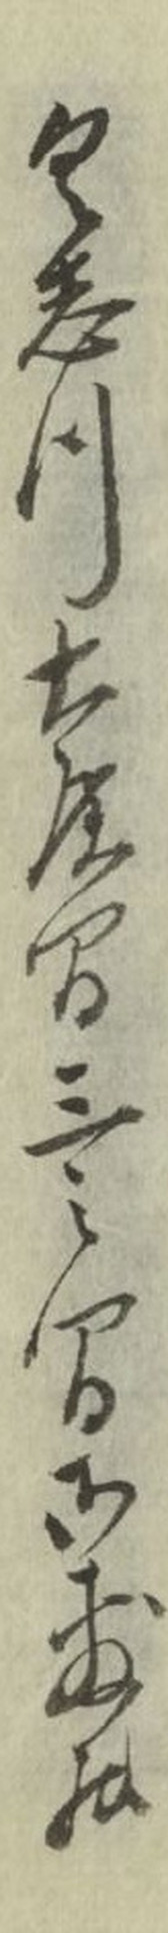具志川大広間三之間御敷居
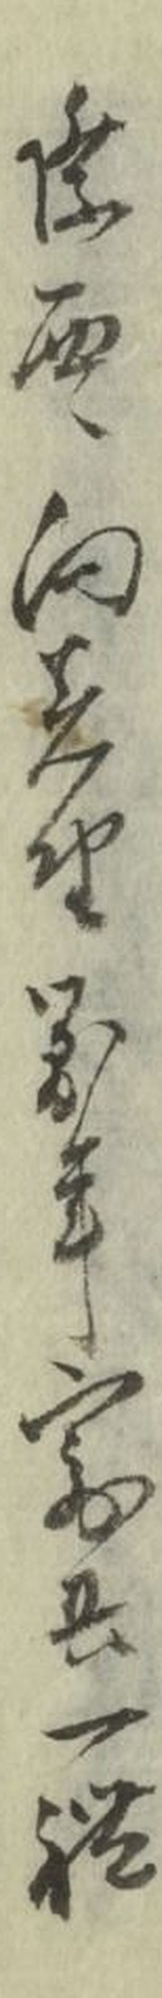際西へ向着坐則年寄共一礼
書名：琉球人来朝記 四之五
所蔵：University of the Ryukyus Library
